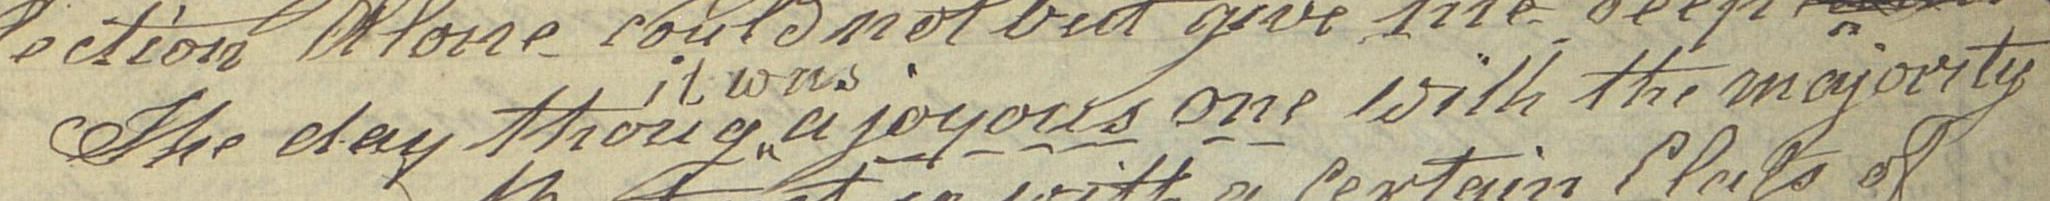The day thoug ^ a joyous one with the majority
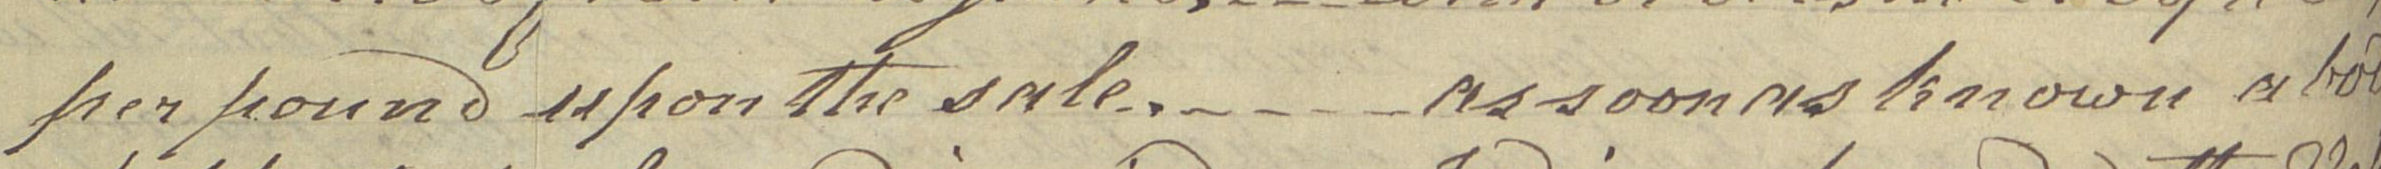per pound upon the sale. as soon as known about
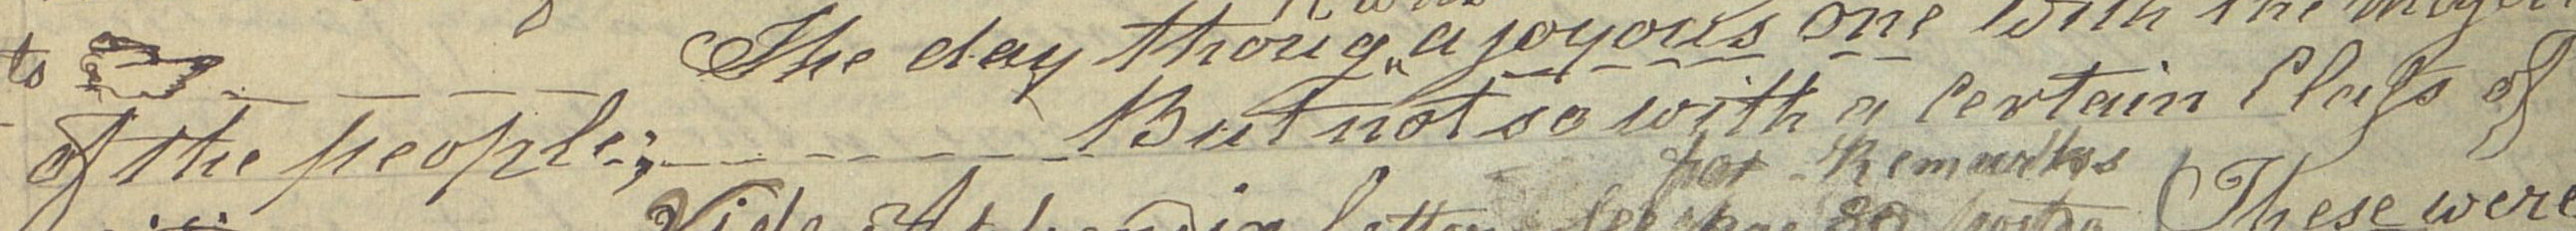of the people; But not so with a certain Class of
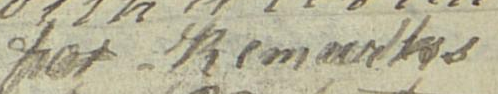for. Remarks
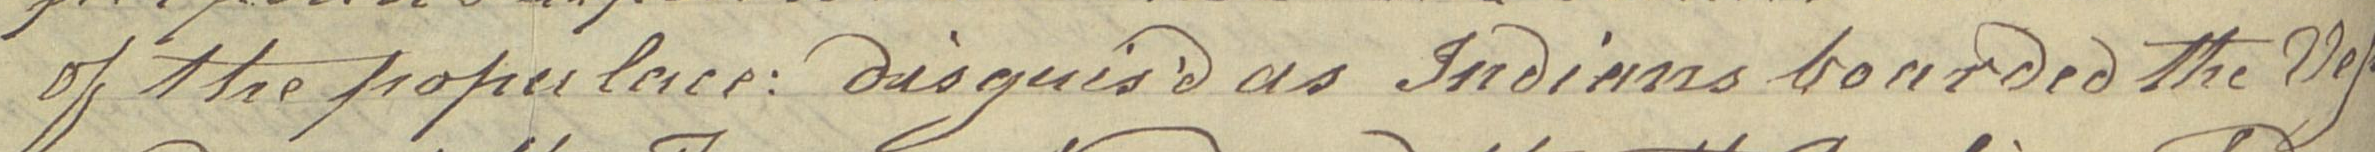of the populace: disguis'd as Indians boarded the Ves-
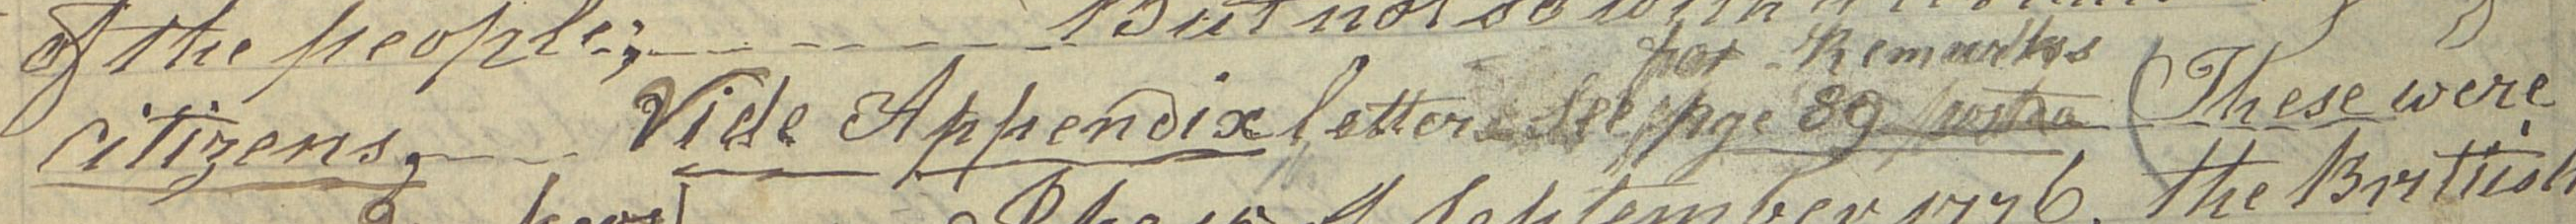citizens, Vide Appendix letter see page 89 ustra (These were
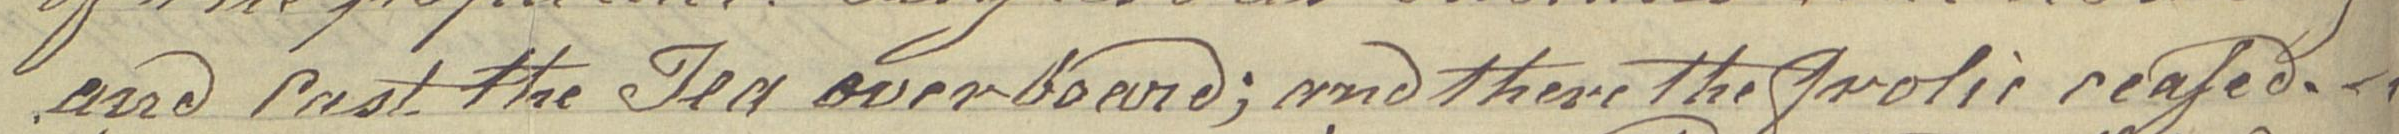and cast the Tea overboard; and there the frolic ceased.
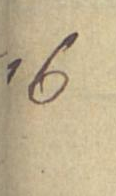6
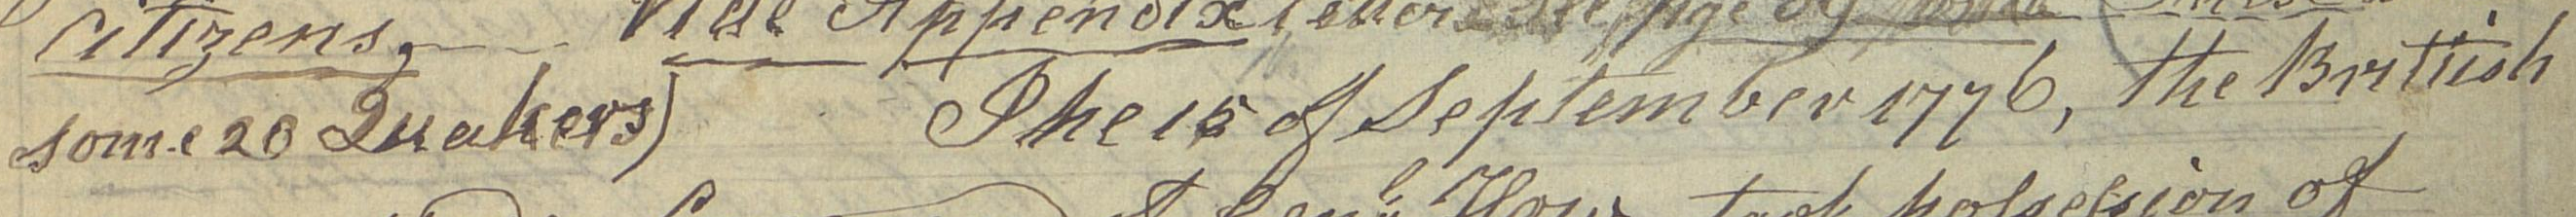some 20 Quakers) The 15 of september 1776, The Brittish
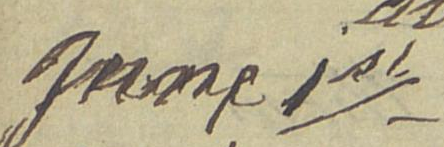June 1^st
